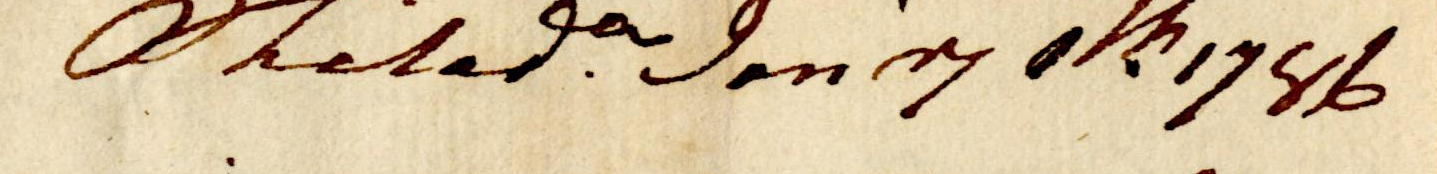Philad^a. Jan^ry 8^th 1786
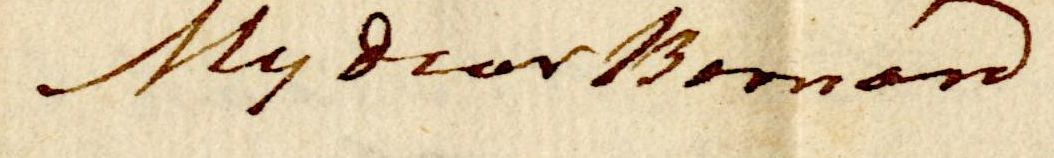My dear Barnard
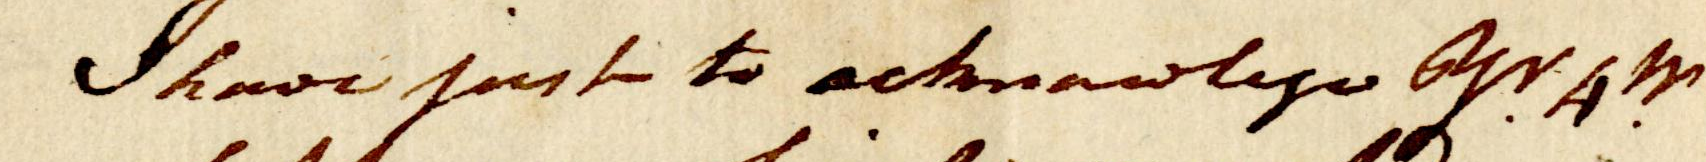I have jist to acknowledge y^r a
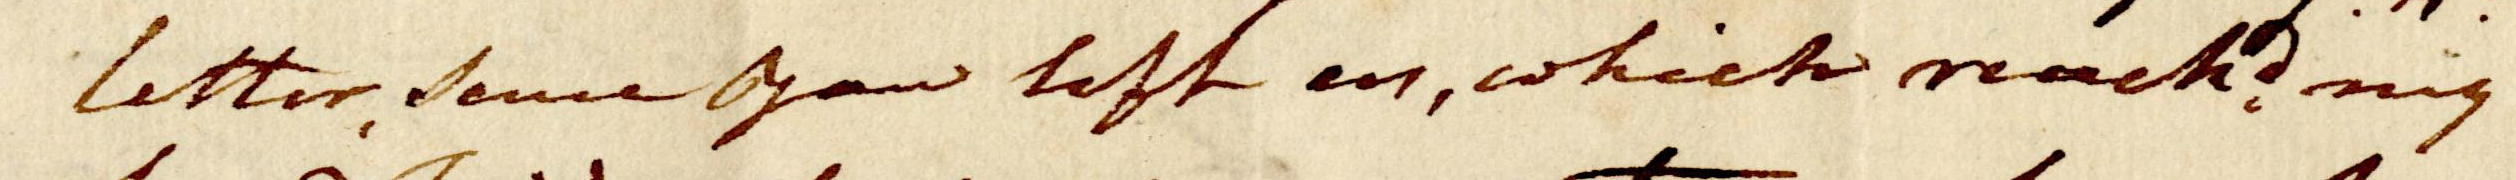letter, since you left an, which reachd my
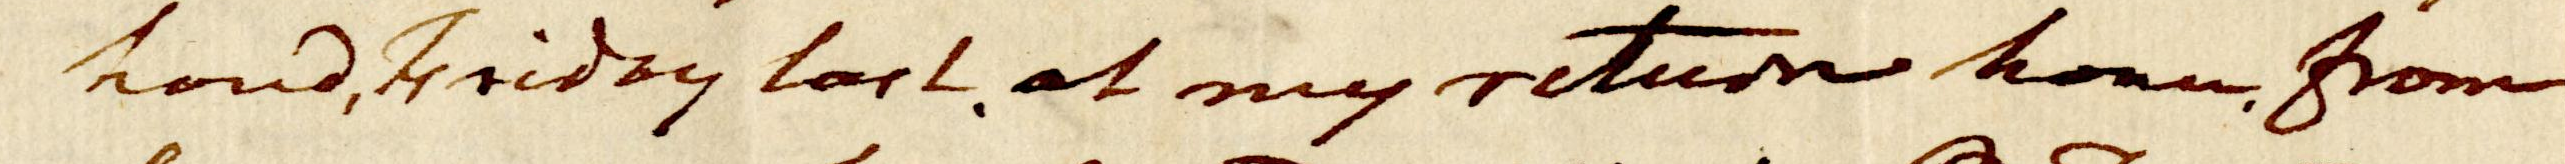hand, Friday last at my return home from
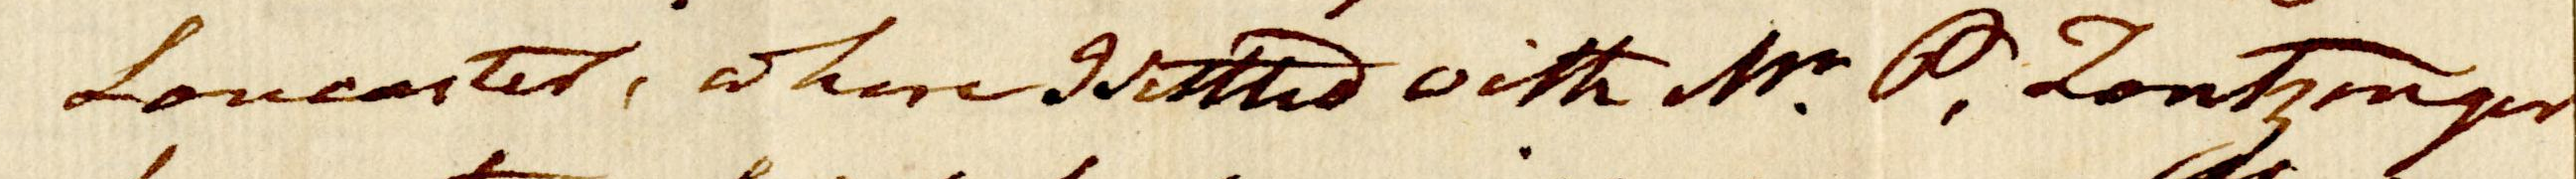Lancaster, where I settled with M^r P. Hanstrager
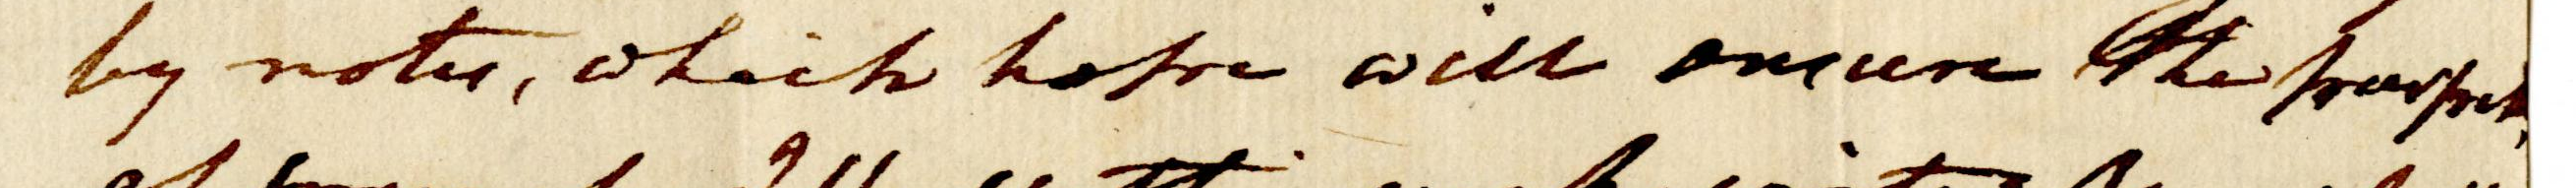by notes, which hope will ensure the purpos
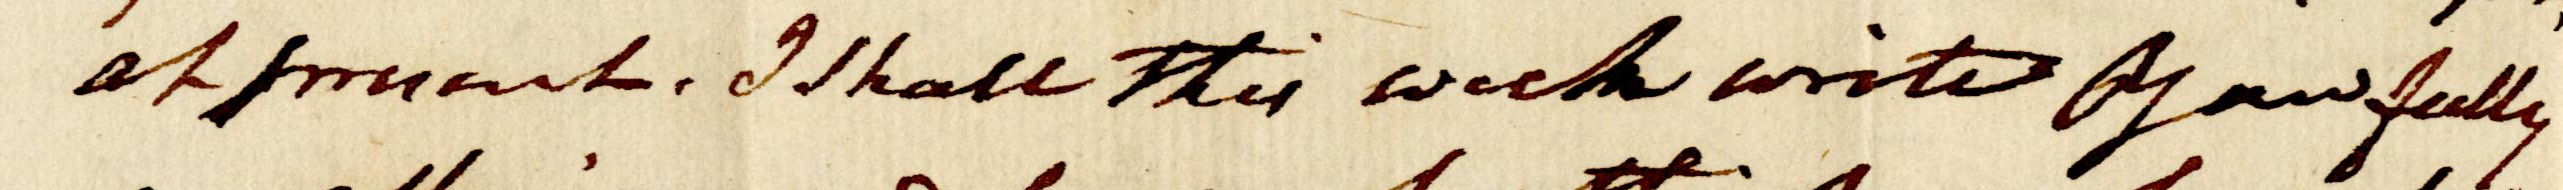at presant. I shall this week write you fully
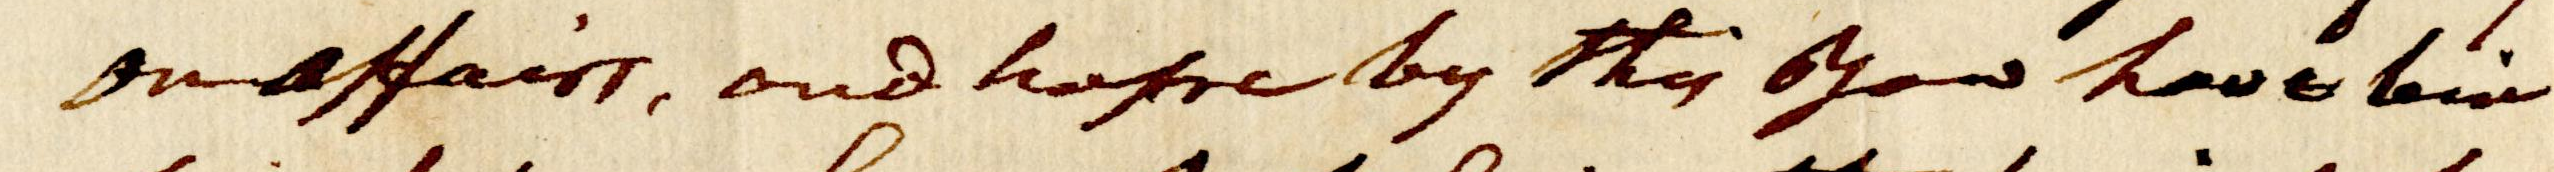on affairs, and hope by this you have bin
